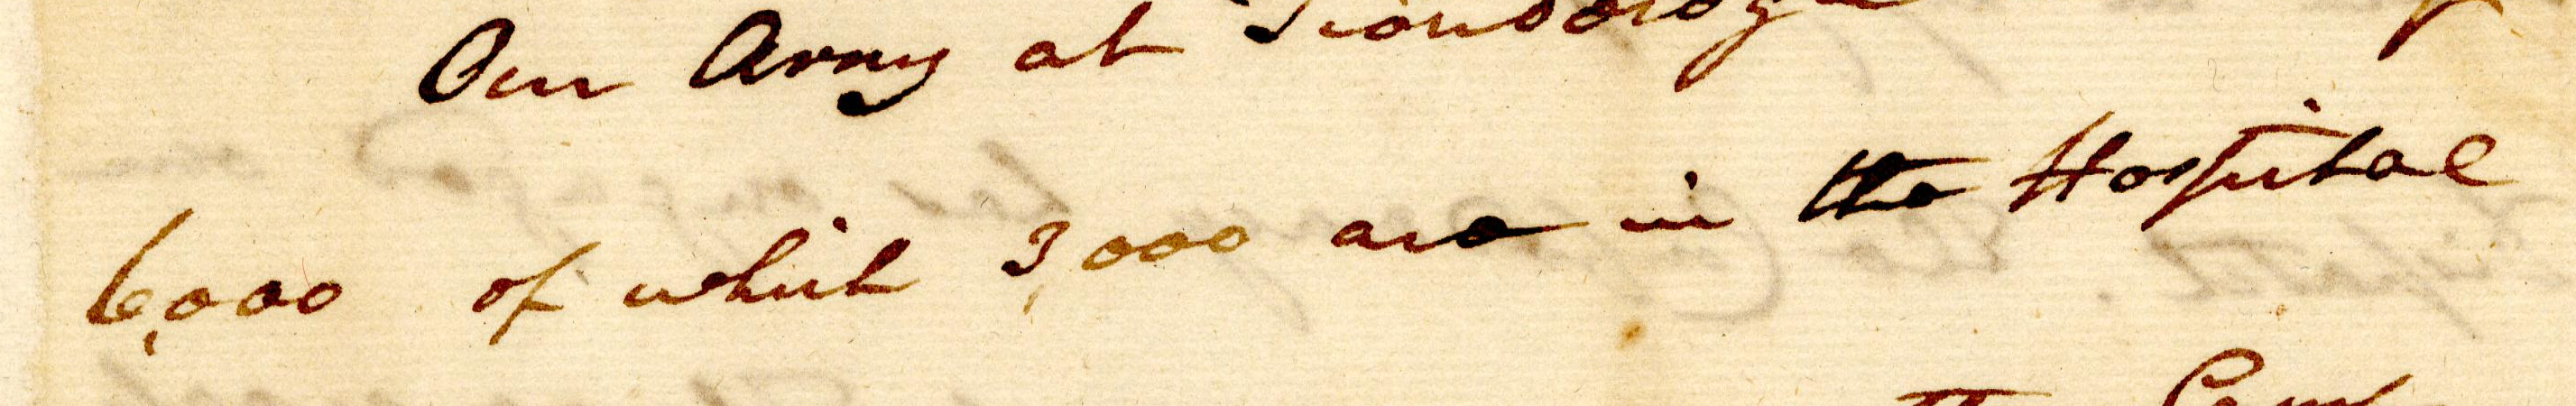6,000 of which 3,000 are in the Hospital
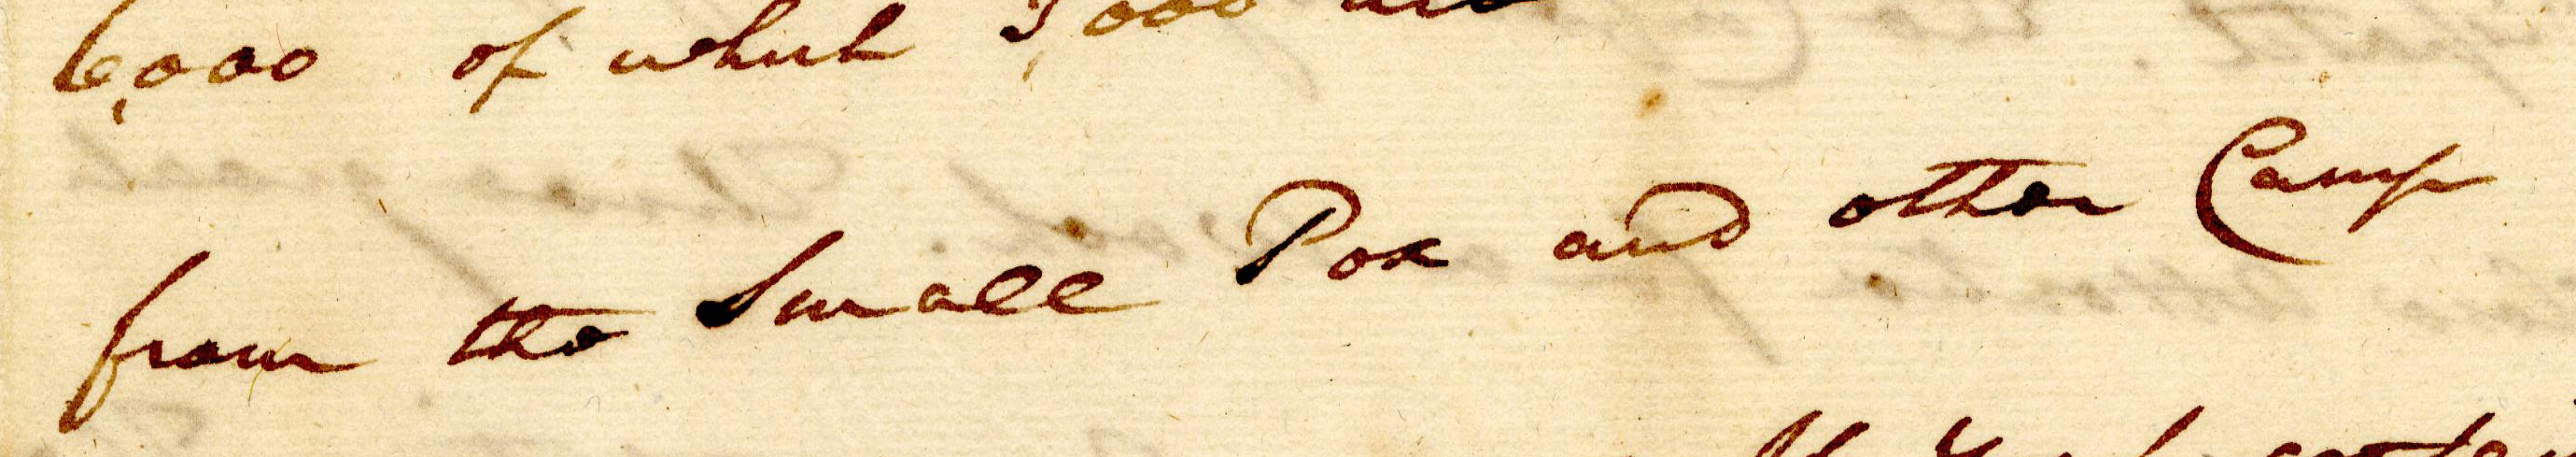from the small Pox and other Camp
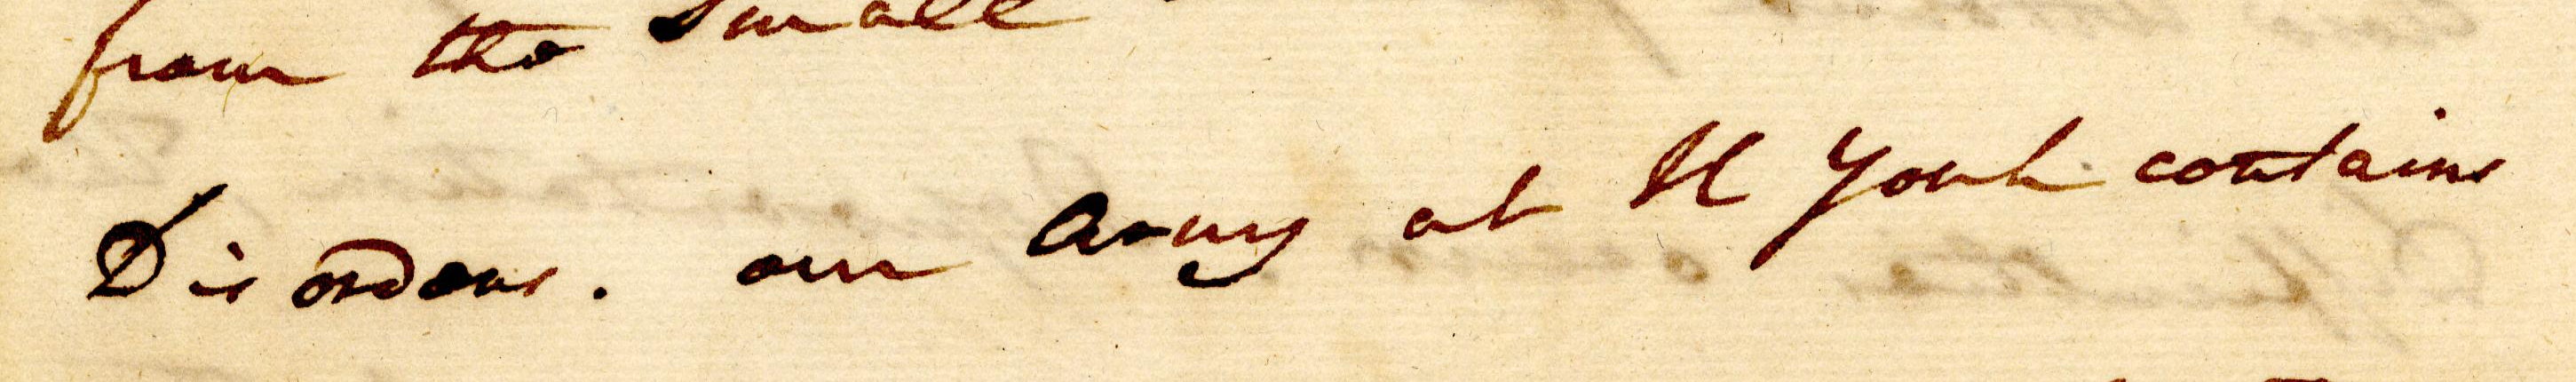Disorder. our Army at N Yorh contains
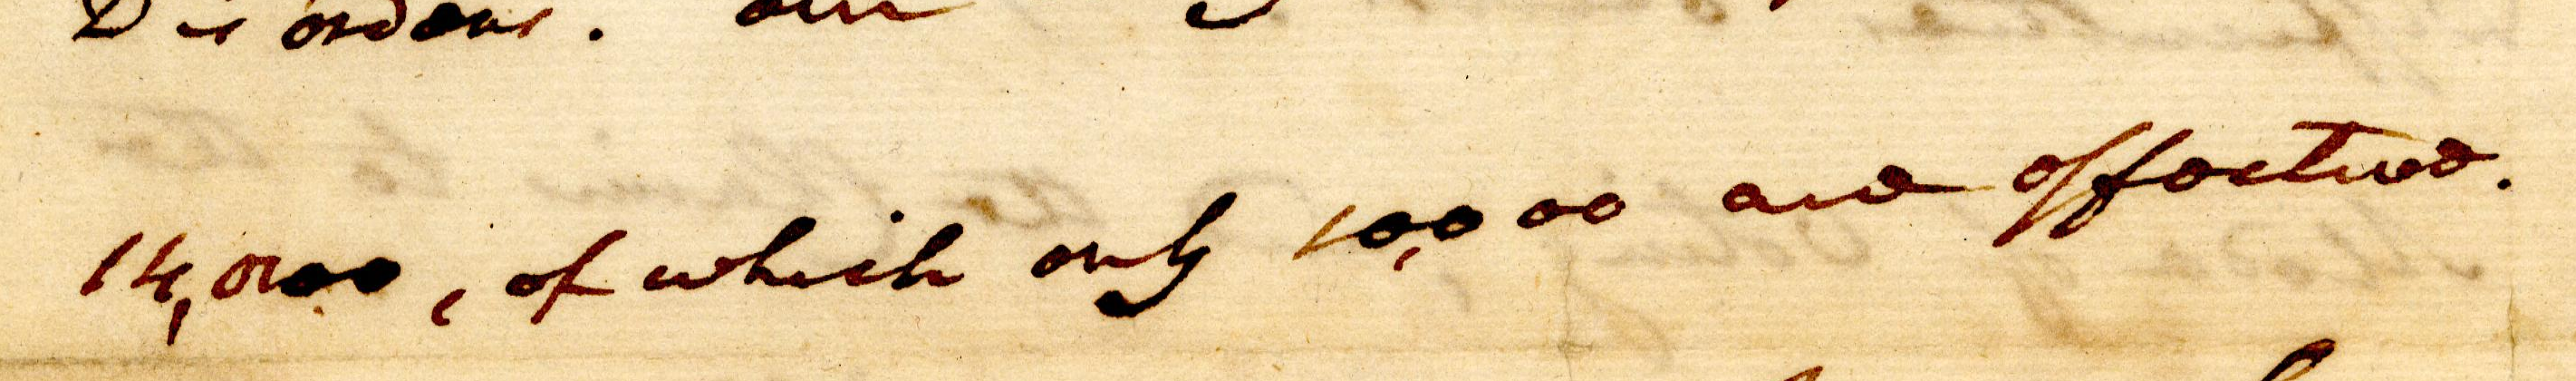14,000, of which only 10,000 are affective.
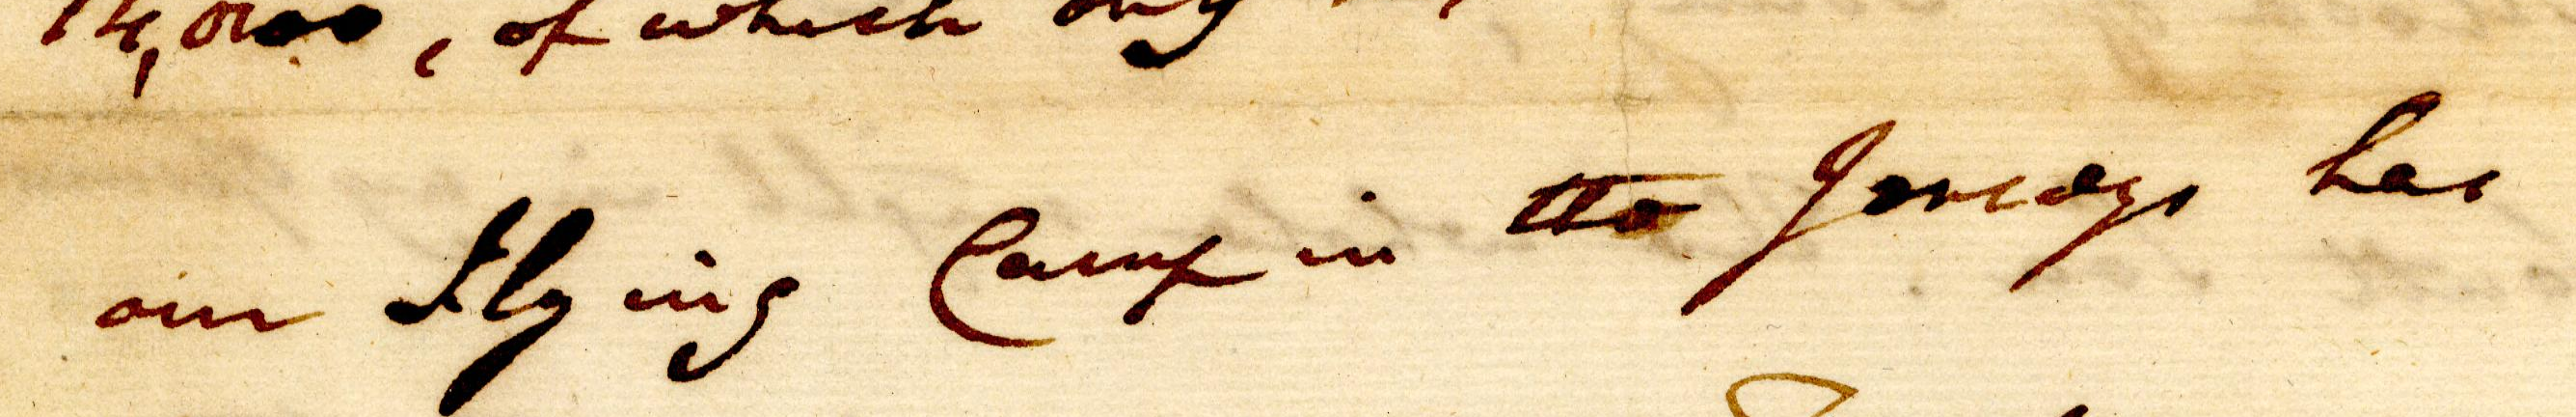our flying Camp in the Jerseys has
